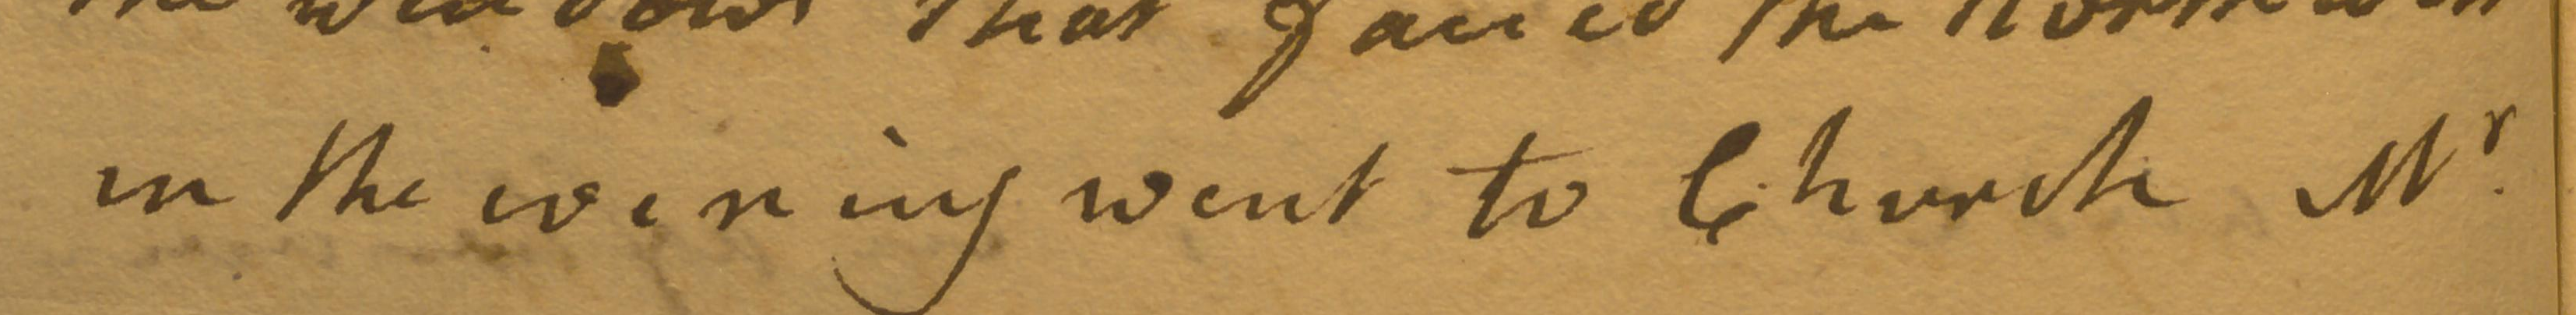in the evening went to Church M^r.
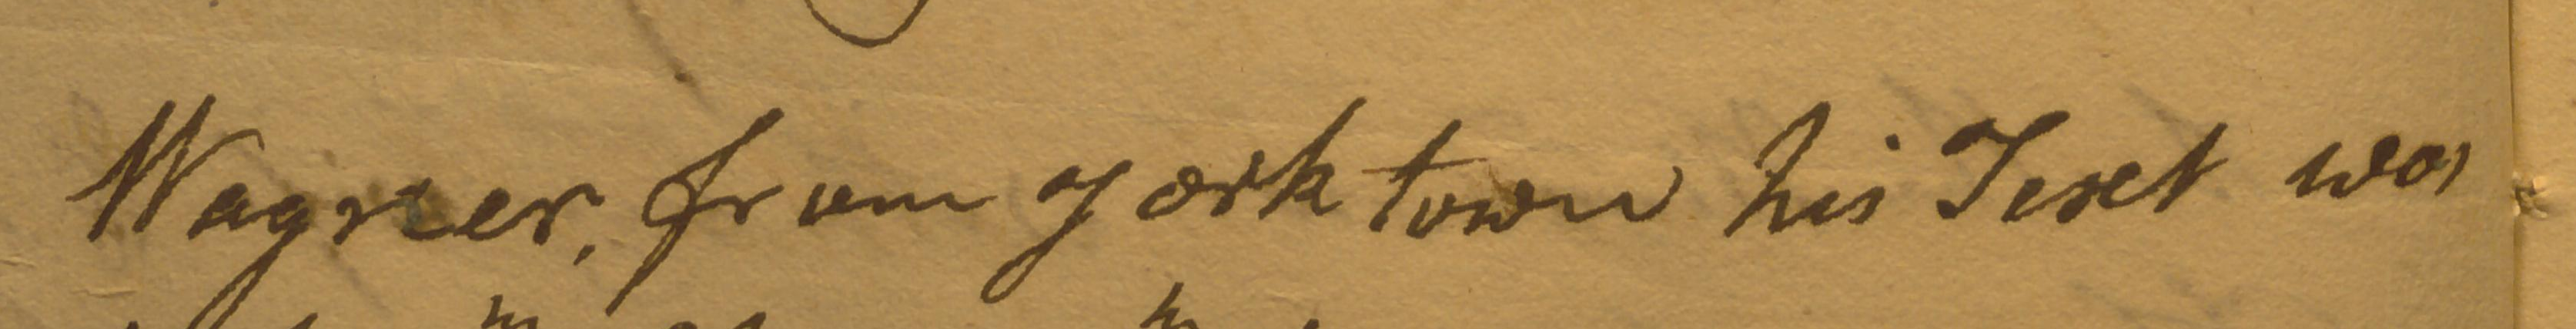Wagner from york town his Text was
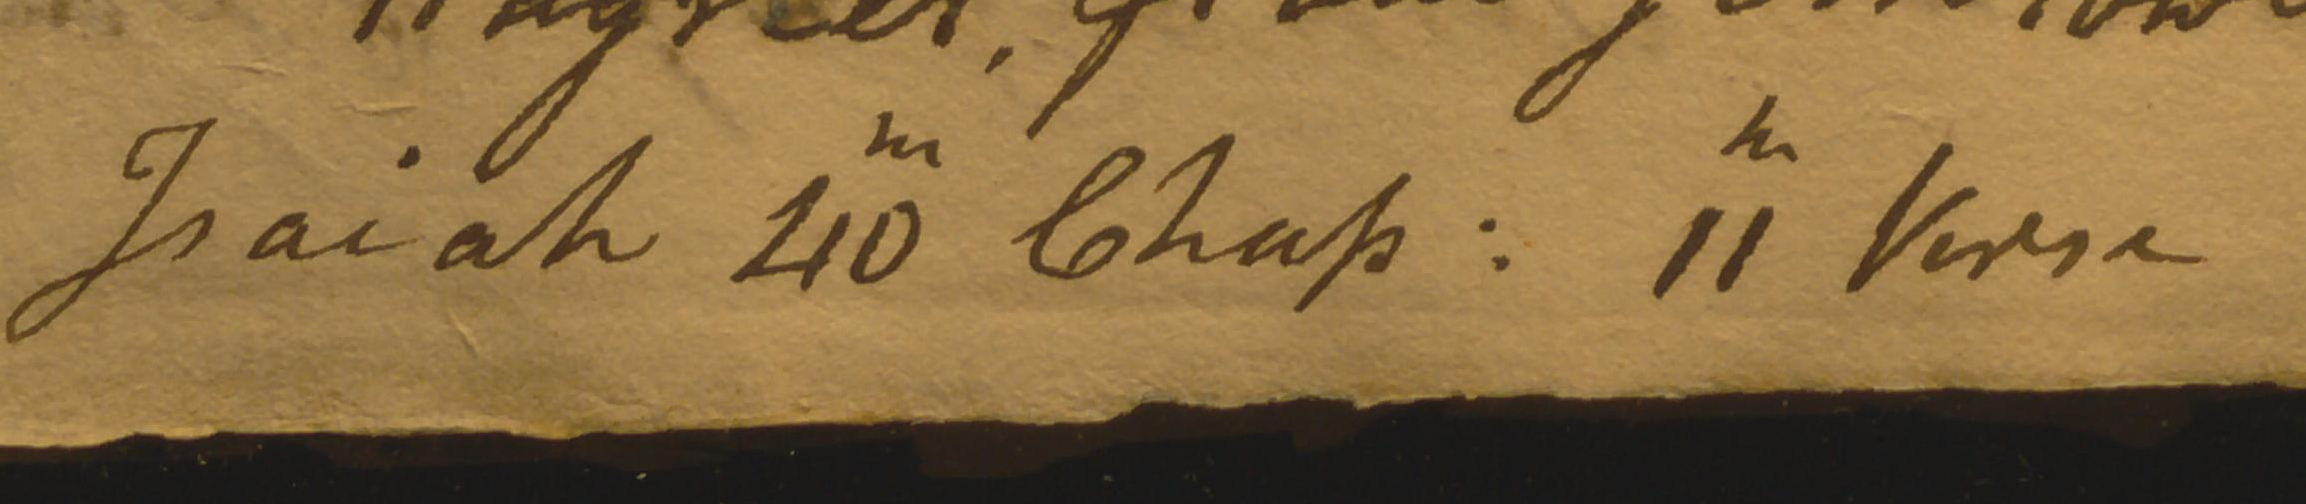Isaiah 40^th Chap: 11^th Verse
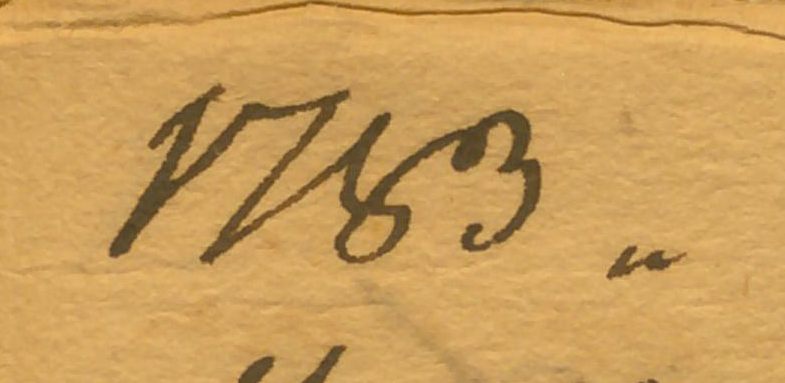1783
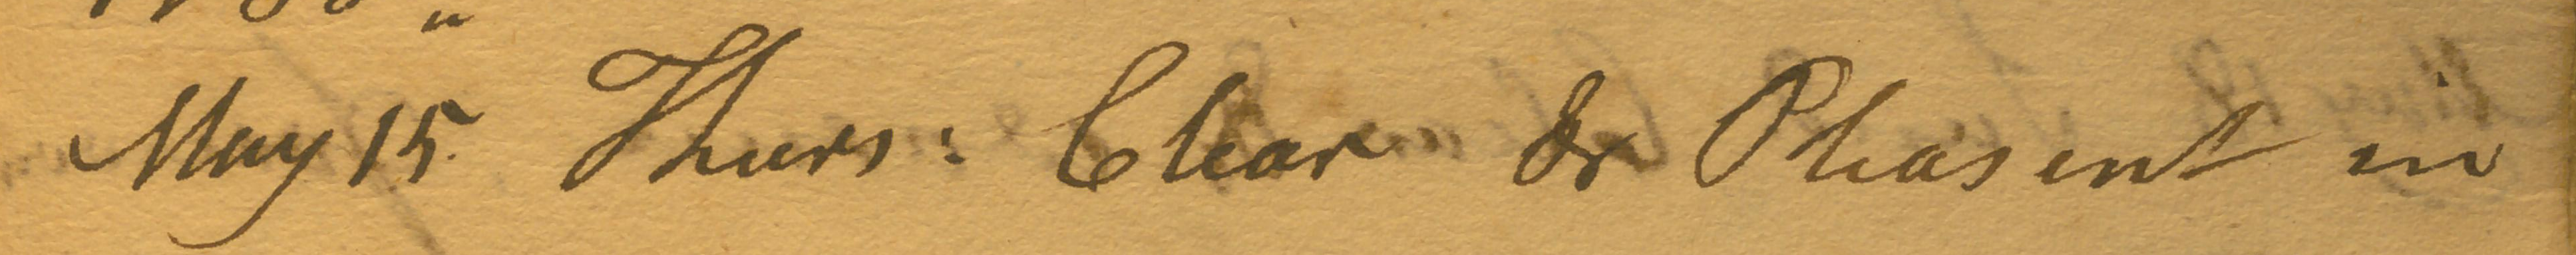May 15^th. Thurs: Clear & Pleasent in
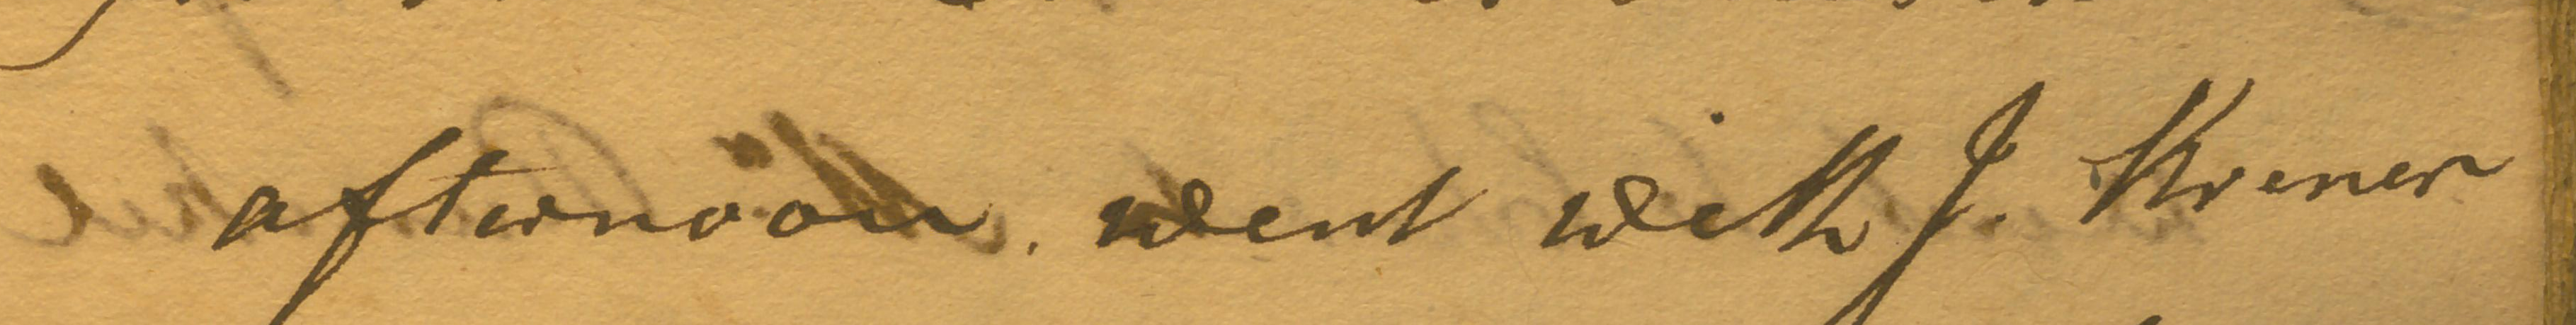afternoon. went with I. Krener
